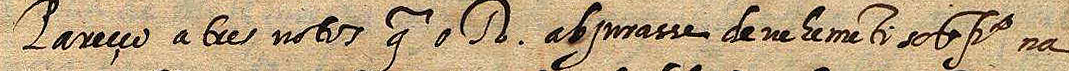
Pareçeo a tres uotos q̄ o R. abjurasse de uehemēti sospto na
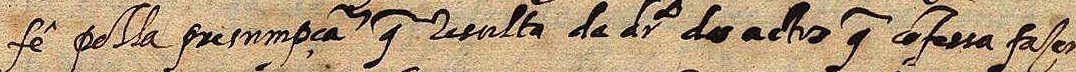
fê pella presumpçā q̄ resulta de drto dos actos q̄ cōfessa fazer
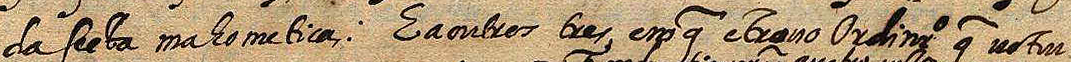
da secta mahometica: E a outros tres, em q̄ ētrou o Ordinro q̄ uotou
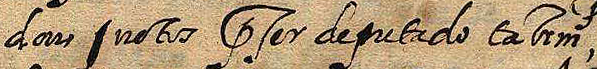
dous _ uotos p̄ ser deputado tābem,
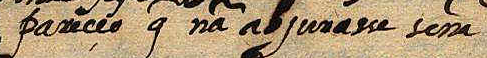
pareçeo q̄ nā abjurasse senā
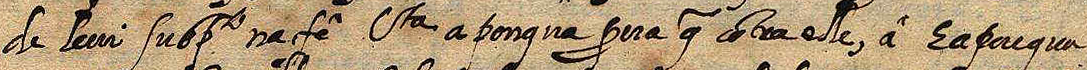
de leui suspto na fê Vta a pouqua ꝓua q̄ cōtra elle, â E a pouqua
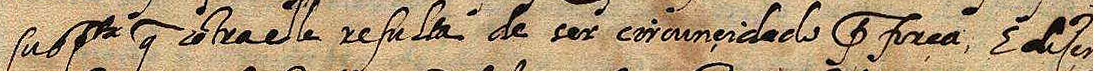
suspta q̄ cōtra elle resulta de ser circunçidado p̄ força, E dizer
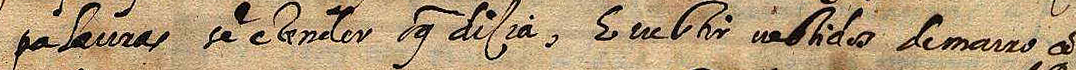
palauras sē ētender o q̄ dizia, E uestir uestidos de mouro cō
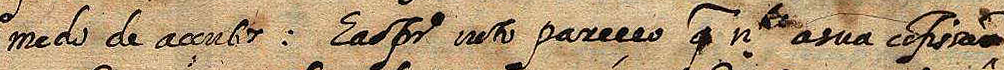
medo de açoutes: E ao pro uoto pareçeo q̄ uta a sua cōfissaõ
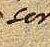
ser
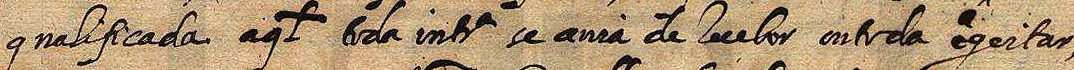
qualificada a ql̄ toda intra se auia de Receber ou toda ēgeitar,
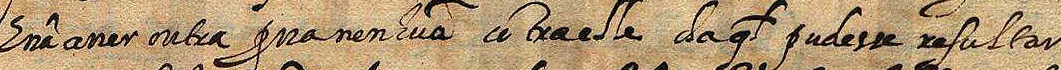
E nā auer outra ꝓua nenhuā cōtra elle da q̄l pudesse resultar
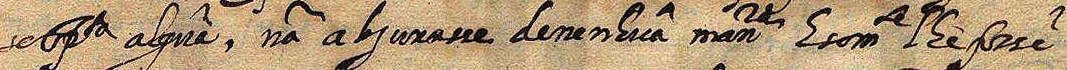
sospta alguā, nā abjurasse de nenhuā manra E somte lhe fossē
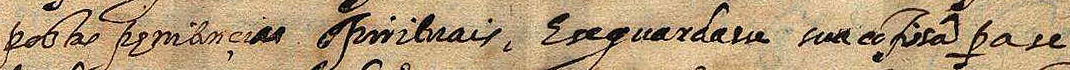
postas penitençias spirituais, E se guardasse sua cōfissā ꝑa se
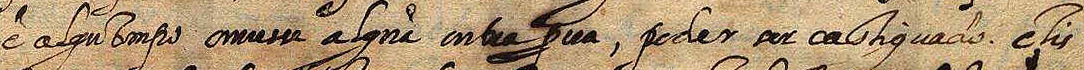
ē algū tempo ouuesse alguā outra ꝓua, poder ser castiguado. ē lis
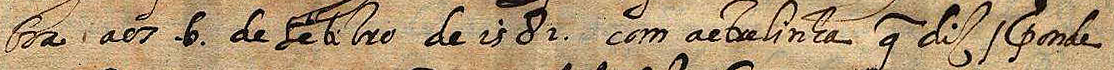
boa aos .6. de setēbro de i581. com a ētrelinha q̄ diz / p̄ onde
